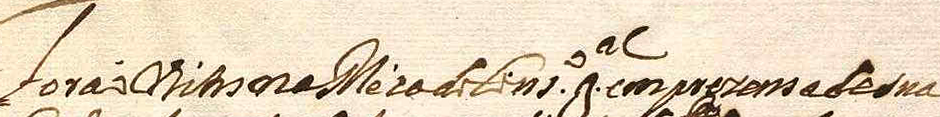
Foraõ Vistos na Méza do Cons.o g.al em prezensa de sua
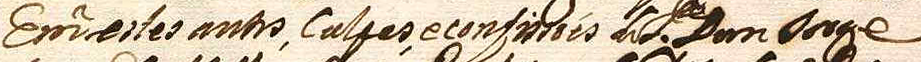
Ema estes autos, Culpas e confissoẽs do P.e Dom Iorge
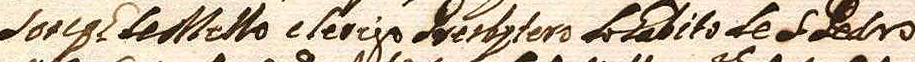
Ioseph de Mello clerigo Presbytero do habito de S. Pedro
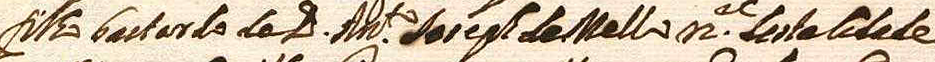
filho bastardo de D. An.to Ioseph de Mello n.al desta Cidade
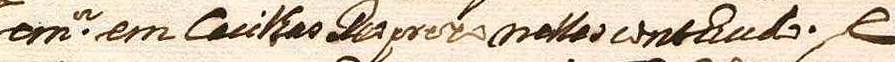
e m.or em Cacilhas Reo prezo nelles contheudo. E
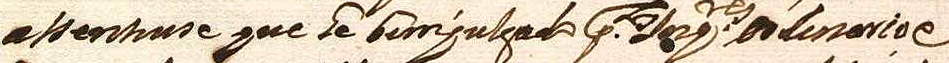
assentouse que he bem julgado p.los Inq.res ordenario e
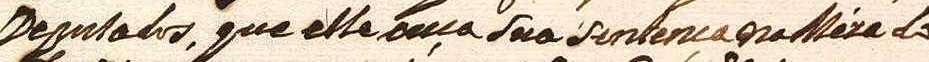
Deputados, que elle ouça sua sentença na Méza do
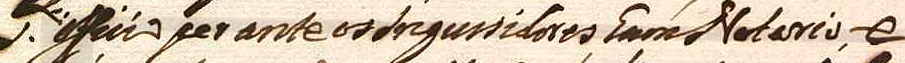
s.to officio perante os Inquisidores, hum Notario, e
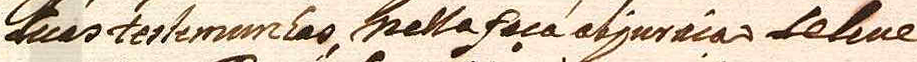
duas testemunhas, nella faça abjuraçao de leue
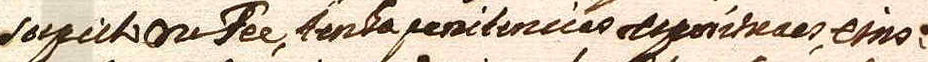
sospeito na Fee, tenha penitencias espirituaes, e ins
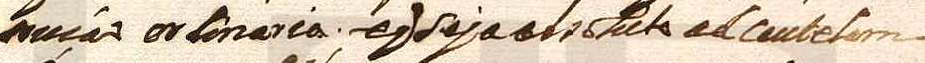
trução ordinaria; e q̄ seja absoluto ad cautelam
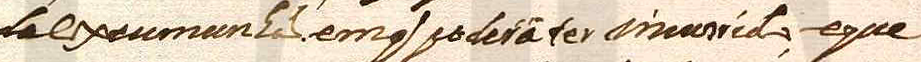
da excumunhaõ em q̄ poderá ter incurrido, e que
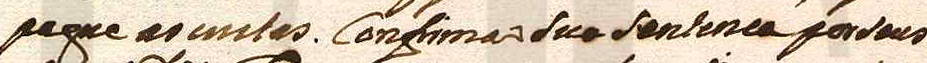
pague as custas. Confirmao sua sentenca por seus
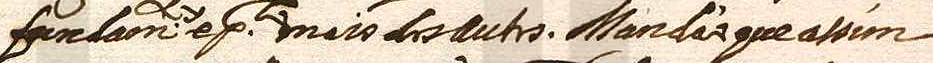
fundam.tos e p.lo mais dos autos. Mandaõ que assim
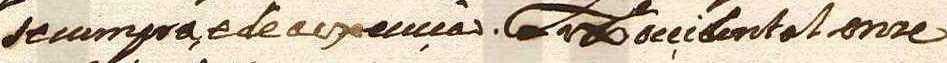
se cumpra, e de a execução. Lix.a occidental onze
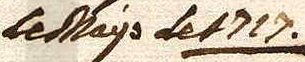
de Mayo de 1717.
